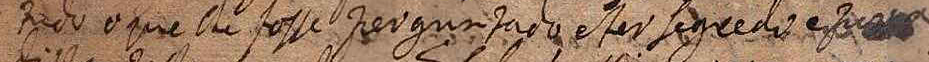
tudo o que lhe fosse perguntado e ter segredo e por a
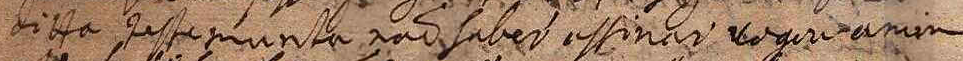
ditta testemunha naõ saber assinar rogou a min
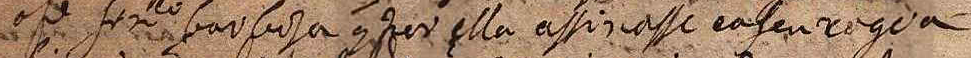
o pe frnco barboza q̄ per ella assinasse e a seu rogo a
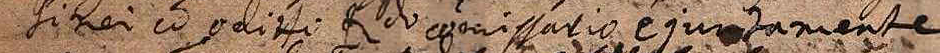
sinei cō o ditto Rdo comissario e juntamente
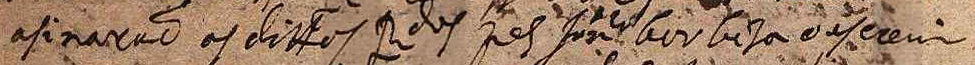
asinaraõ os dittos Rdos pes frnco barboza o escreui
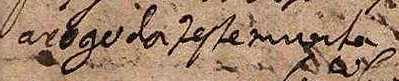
a rogo da testemunha
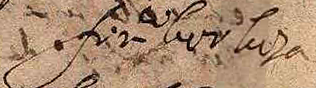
frnco barboza
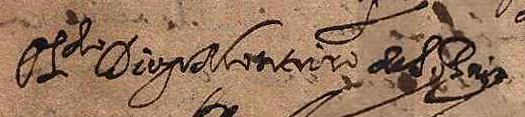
O Ldo Diogo Monteiro de S. Payo
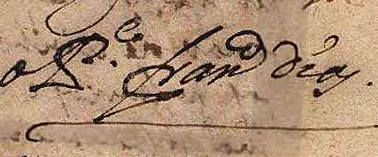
o P.e fran.co dias.
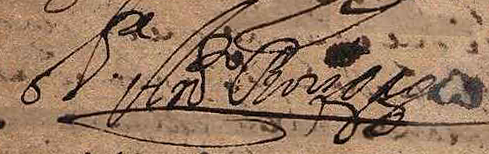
o P.e Anto Roiz̄ gag_
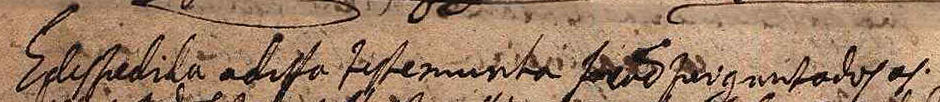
E despedida a ditta testemunha foraõ perguntados os
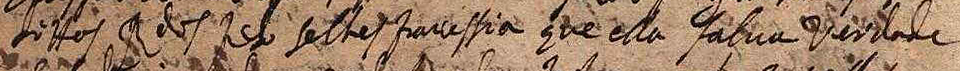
dittos Rdos pes se lhes paressia que ella falua verdade
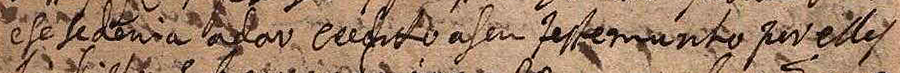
e se se deuia a dar credito a seu testemunho por elles
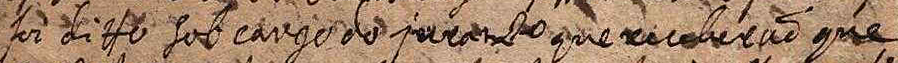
foi ditto sob cargo do juramto que receberaõ que
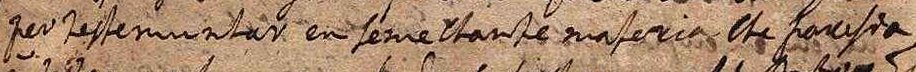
per testemunhar en semelhante materia lhe paresia
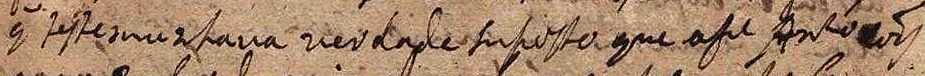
q̄ testemunhaua verdade suposto que o pe Anto roīs
